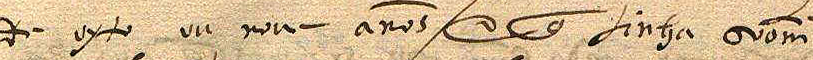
de oyto ou noue an̄os / e q̄ tinha soomte
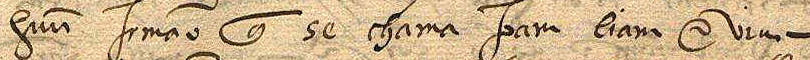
huū Jrmão q̄ se chama Joam liam e viue
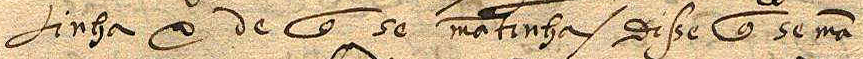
tinha e de q̄ se m̄atinha / disse q̄ se m̄a
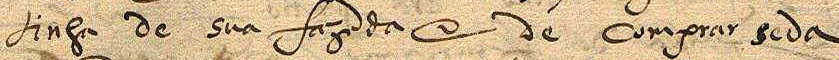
tinha de sua fazēda e de comprar seda
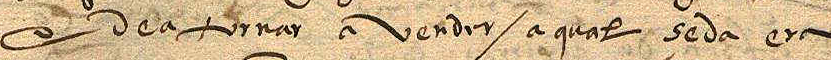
e de a tornar a vender / a quaL seda era
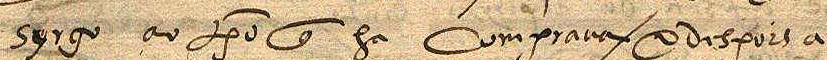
syrgo ao tp̄o q̄ ha Comprava / e despois a
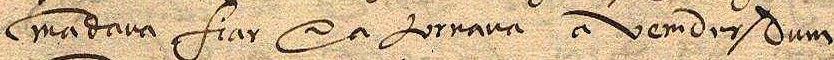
m̄adaua fiar e a tornaua a vemder / Dum
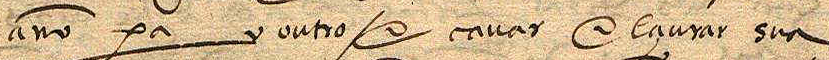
an̄o ꝑa o outro / e cauar e laurar sua
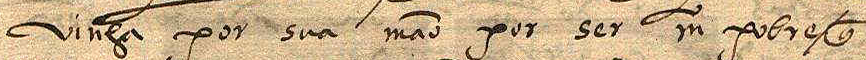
vinha por sua mão por ser mto pobre / q̄
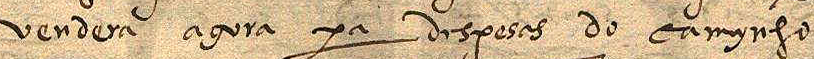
vendera agora ꝑa despesas do camynho
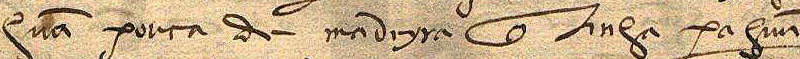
huā pouca de madeyra q̄ tinha ꝑa huū
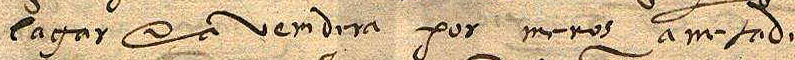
lagar e a vemdera por menos ametade
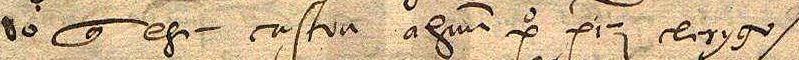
do q̄ lhe custou a huū po p̄iz clerygo /
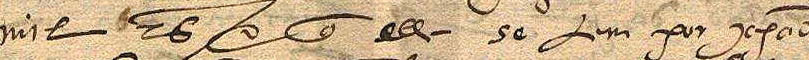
miL r̄s /e q̄ elle se tem por xpãao
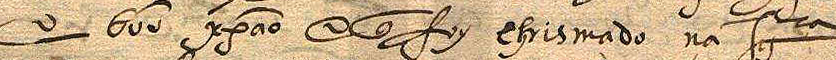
e boō xpão e q̄ foy chrismado na Jgra
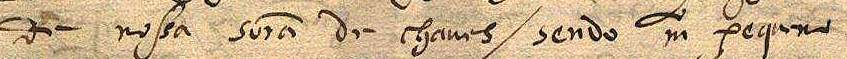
de nossa sōra de chaues / sendo mto pequeno
